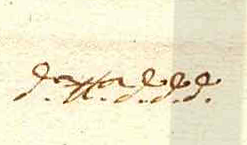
d.a tt.a d.o d.o d.o
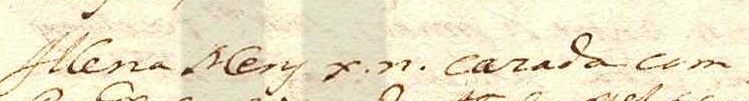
Jllena Hens x. n. cazada com
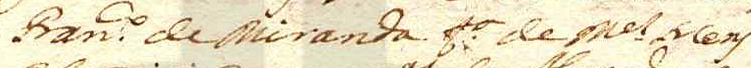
Fran.co de Miranda f.a de M.el Hens
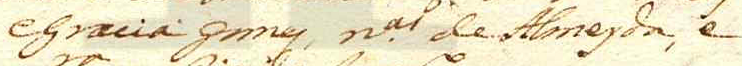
e Gracia Gomes, n.al de Almeyda, e
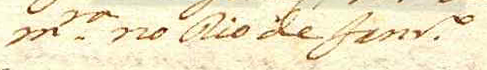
m.ra no Rio de Janr.o
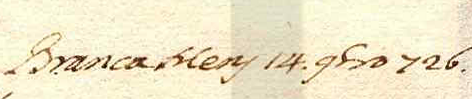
Branca Hens 14. 9bro 726.
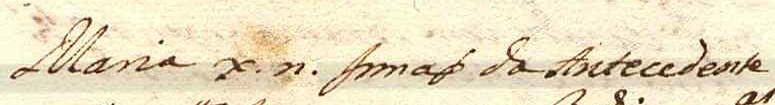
Maria x. n. Jrmaꝭ da Antecedente
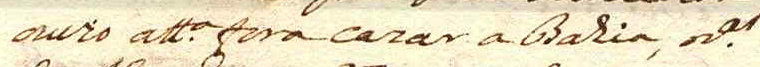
ouvio a tt.a fora cazar a Bahia, n.al
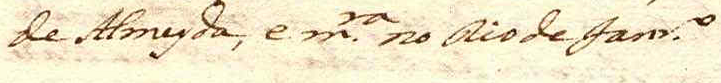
de Almeyda, e m.ra no Rio de Janr.o
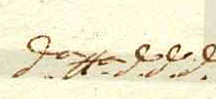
d.a tt.a d.o d.o d.o
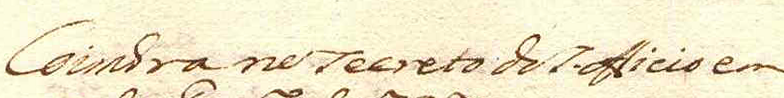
Coimbra no secreto do s. officio em
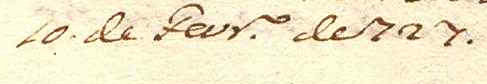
10. de Fevr.o de 727.
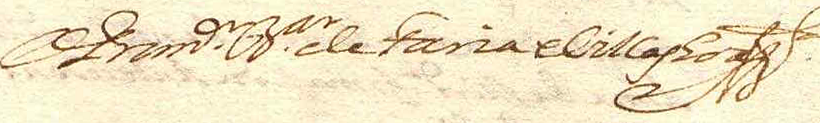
O Prom.or B.ar de Faria e Villas boas
